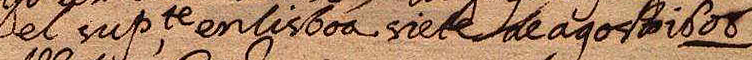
el supte, en lisboa siete de agosto i608
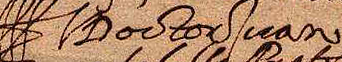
Doctor Juan
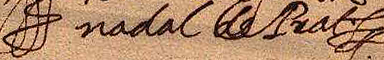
nadal de Pratꝭ
